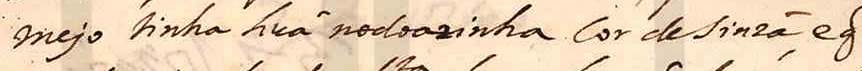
mejo tinha huā nodoazinha cor de sinza, e q̄
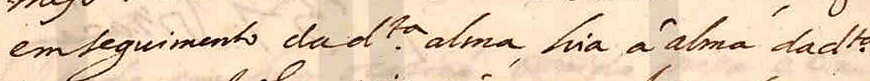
em seguimento da dt.a alma, hia a alma da dt.a
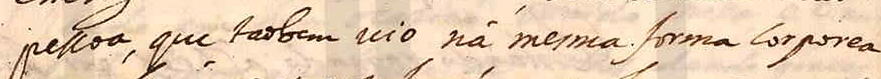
pessoa, que taobem uio ná mesma forma corporea
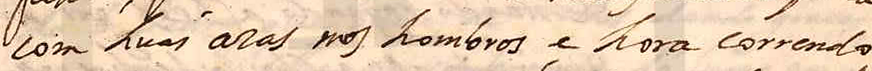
com huās azas nos hombros, e hora correndo
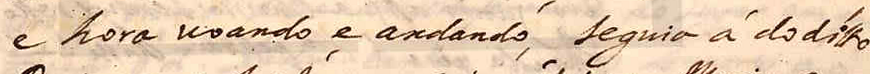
e hora uoando e andando seguia á do ditto
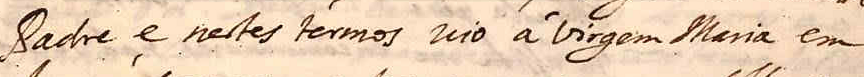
Padre, e nestes térmos vio á Virgem Maria em
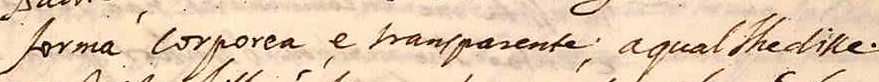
forma corporea, e transparente, a qual lhe disse
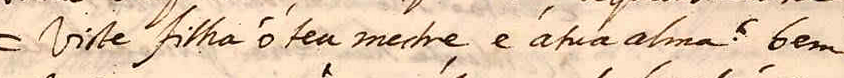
= Viste filha ó teu mestre, e a tua alma? bem
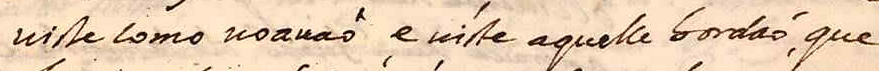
uiste como uoauaõ, e uiste aquelle bordaõ, que
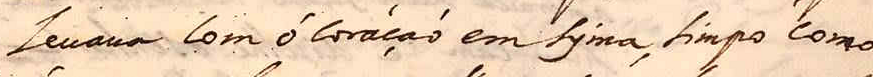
Leuaua com ó coraçaõ em syma, limpo como
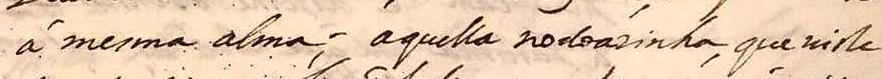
á mesma alma, aquella nodoazinha, que uiste
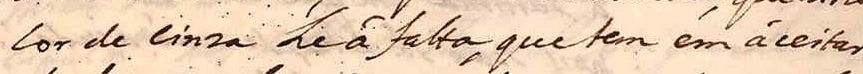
cor de cinza he á falta, que tem em áceitar
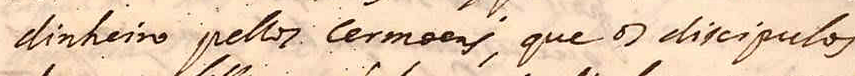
dinheiro pellos cermoens, que os discipulos
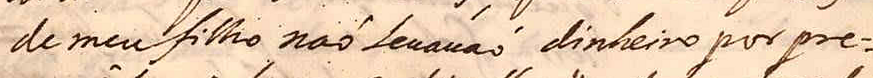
de meu filho naõ leuauaõ dinheiro por pre
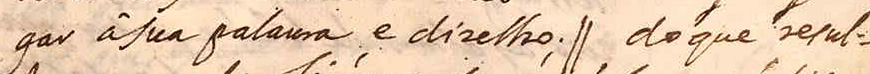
gar á sua palaura, e dizelho; // do que resul
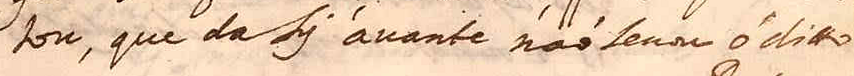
tou, que dahy áuante naõ leuou o ditto
